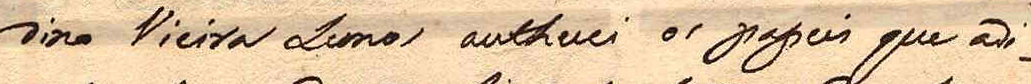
dino Vieira Lemos authuei os papeis que adi
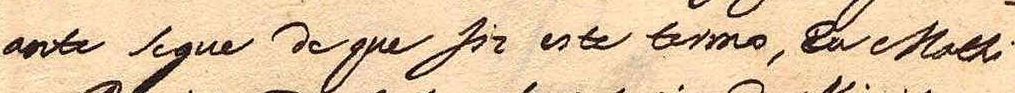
ante segue de que fiz este termo, Eu Mathi
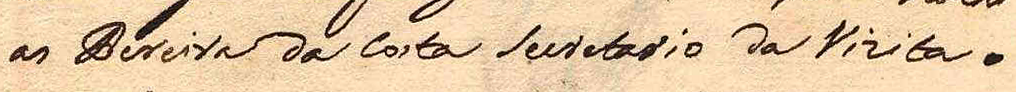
as Pereira da costa secretario da Vizita o
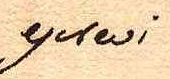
escrevi
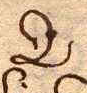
2
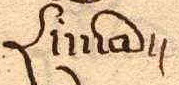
Lima
